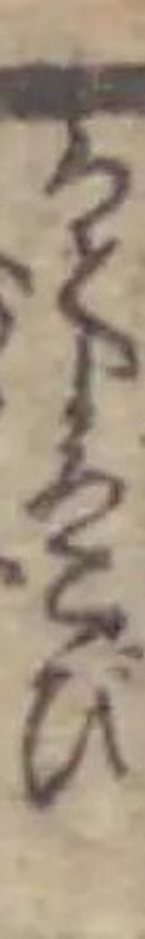かとよろこび
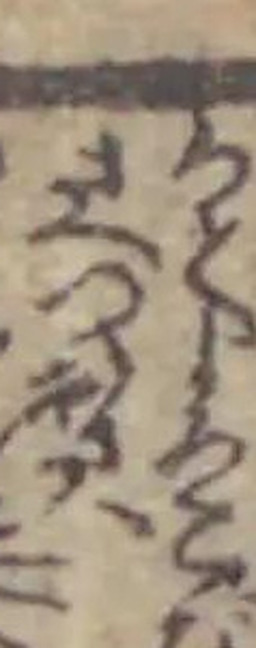さへつおさへ
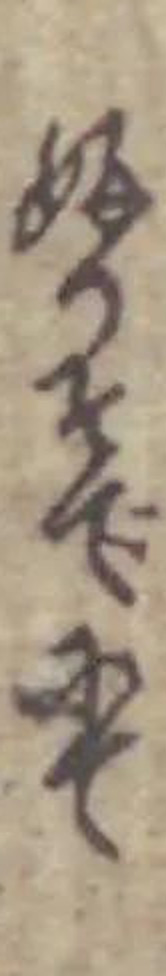ふりそでにて
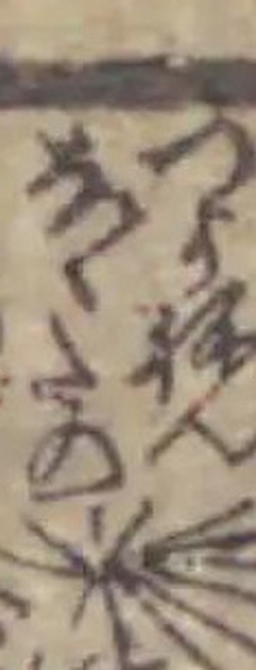なくたの
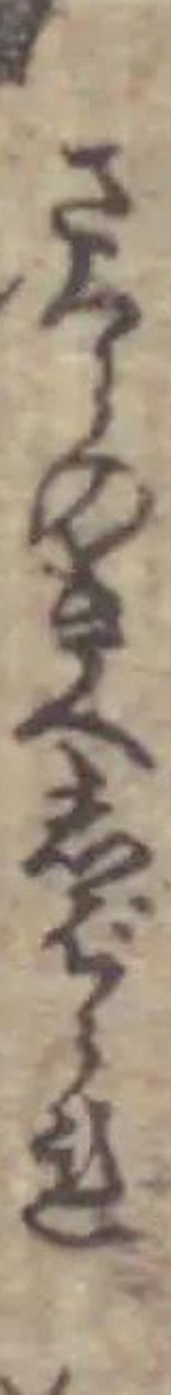さくらのきへしばられ
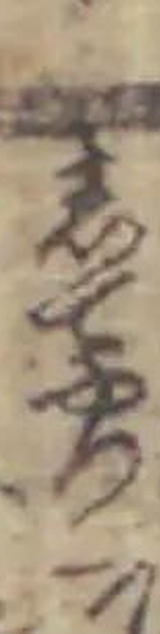してやつ
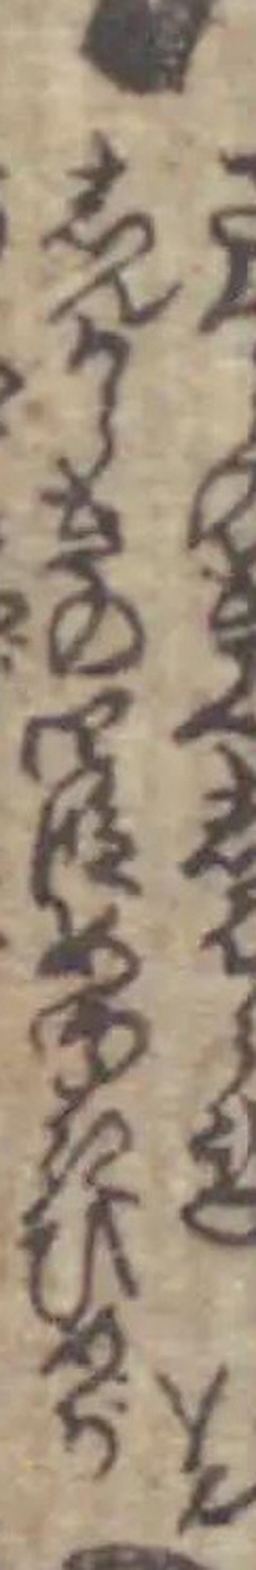しんかうきの四段めゆきひめが
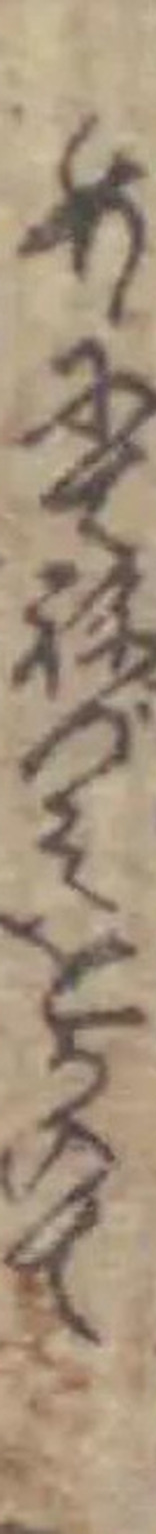あしにてねづみをかいて
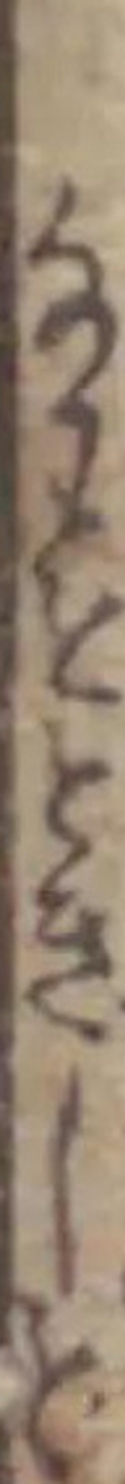なわをときしを
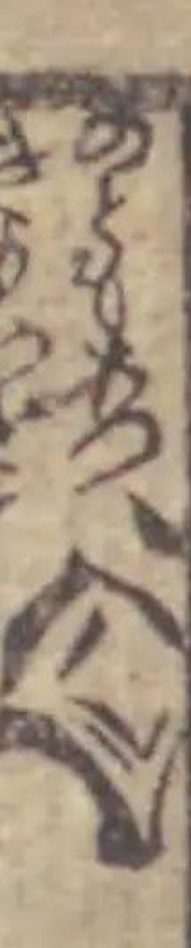のともあつ
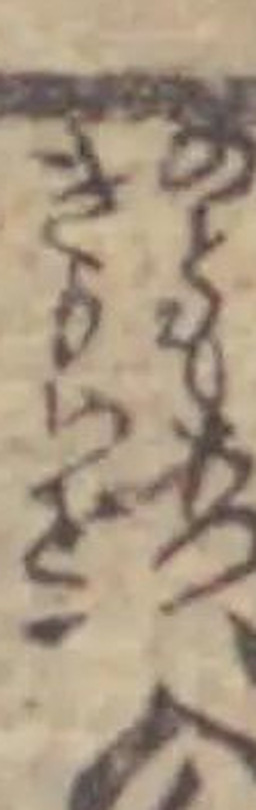きもちを
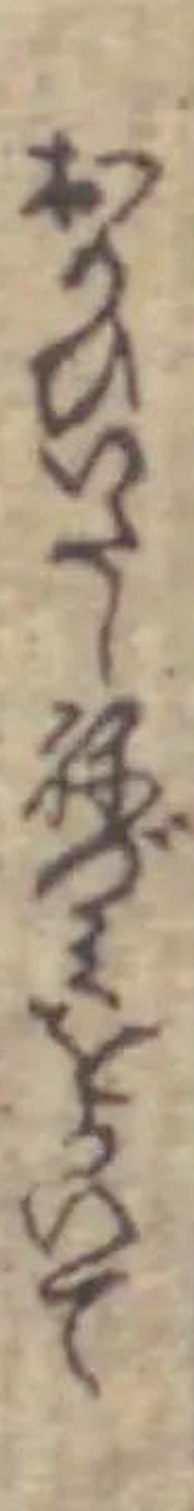おもひいたしねづみをかいて
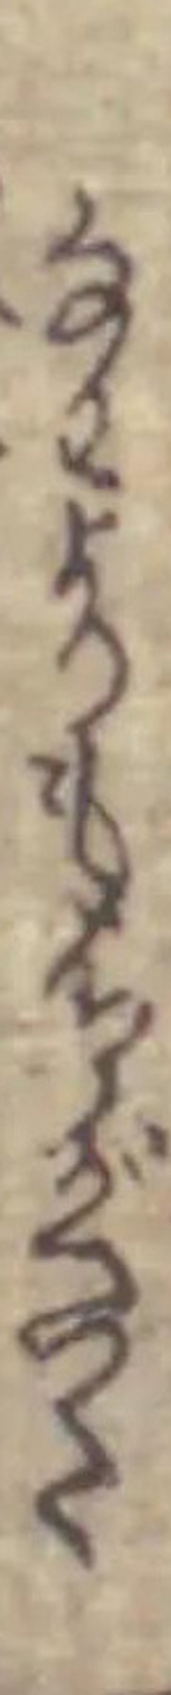なわよりもはらがへつた
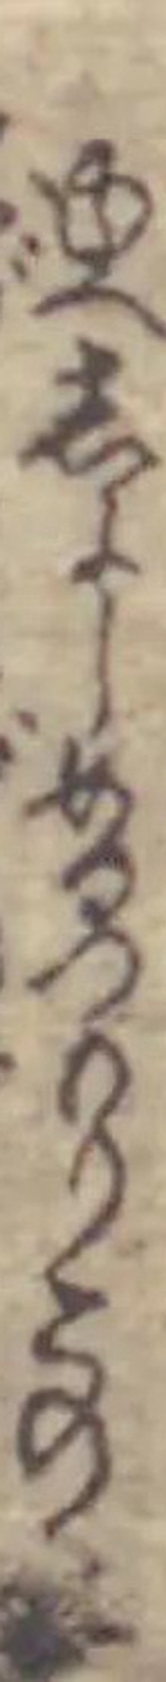ゆへしよしめるつもりこの
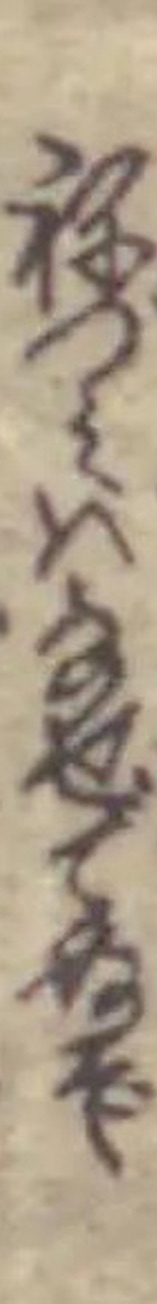ねづみはなぜてぬぞ
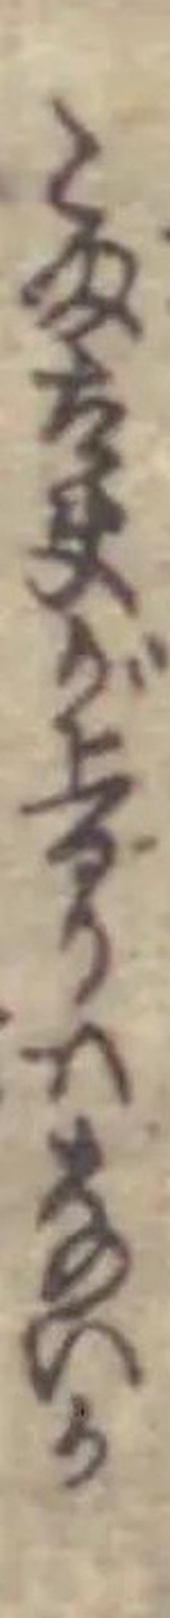こま太夫が上るりはないか
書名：化物昼寝鼾 2巻
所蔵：国立国会図書館 National Diet Library, JAPAN
